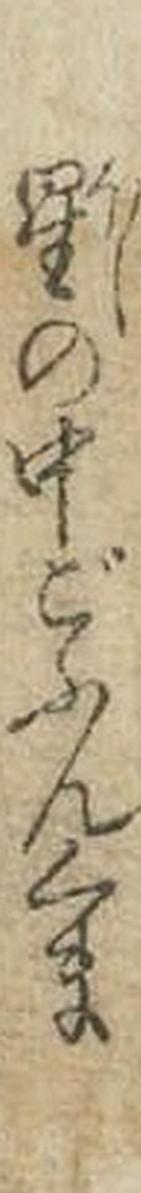星の中ごふんくま
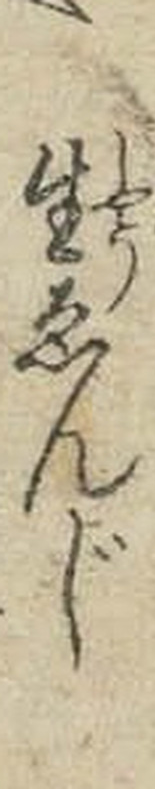生ゑんじ
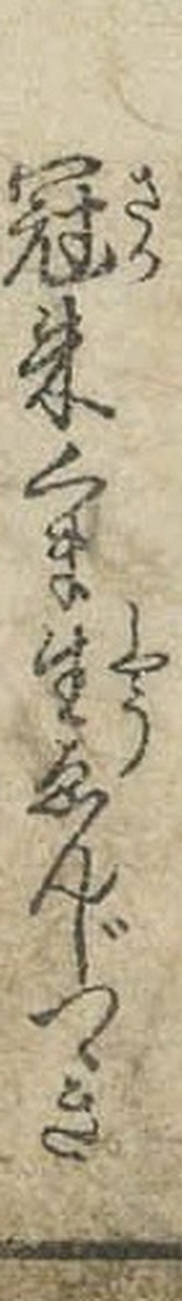冠朱くま生ゑんじつゝき
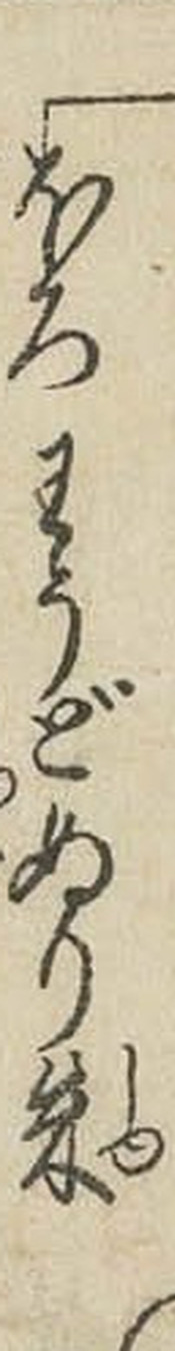ほろわうどぬり朱
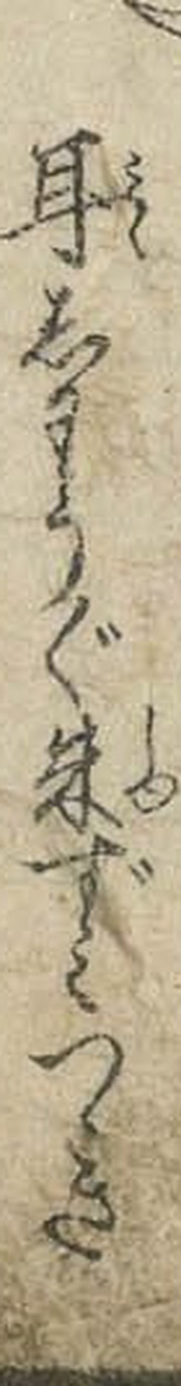耳しわうぐ朱ずみつゝき
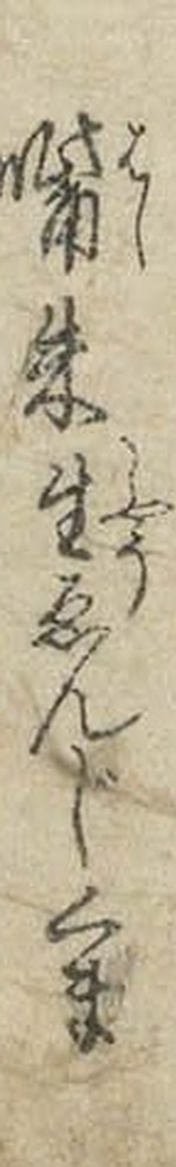毛かき生ゑんじくま
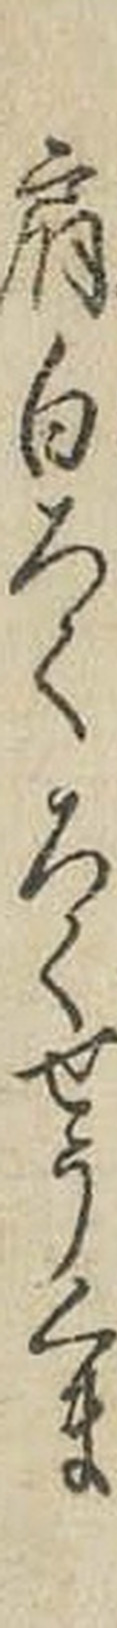肩白ろくろくせうくま
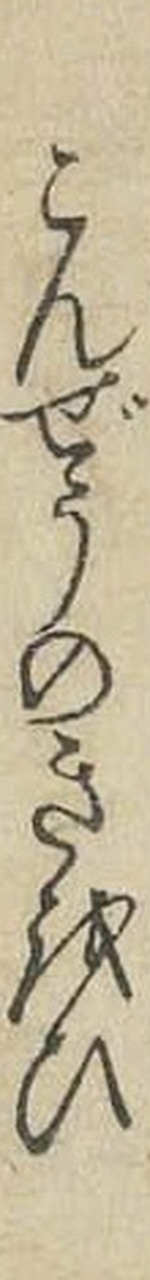こんぜうのきをひ

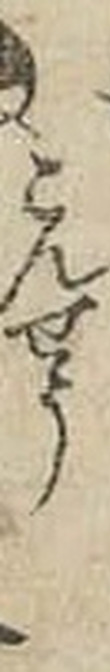こんせう
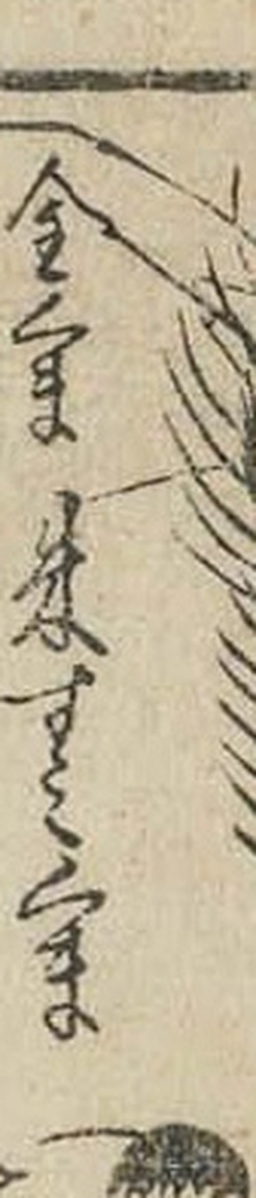金くま朱すみくま合
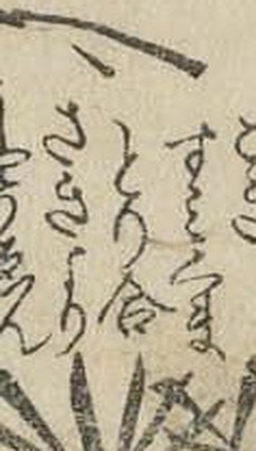とり合
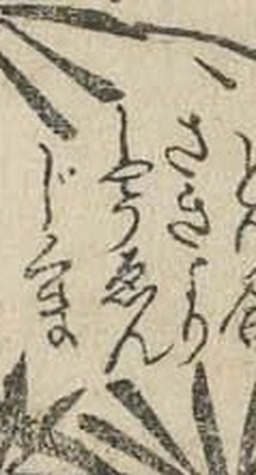しやうゑん
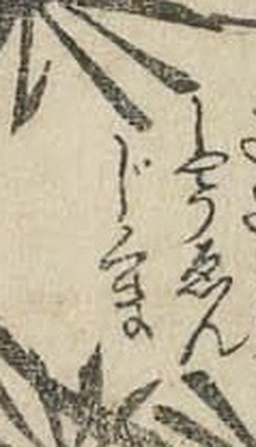じくま
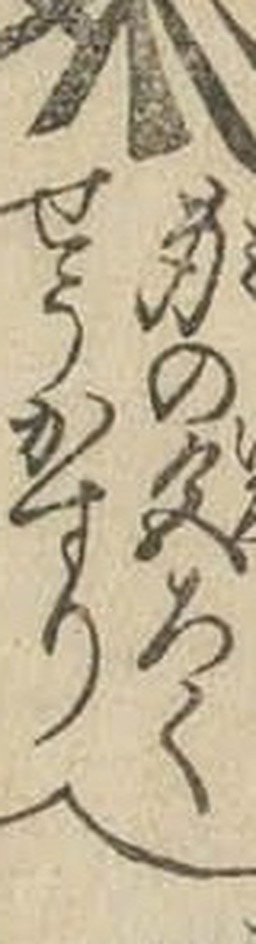せうかすり
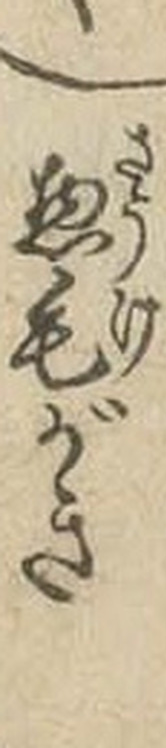青毛がき
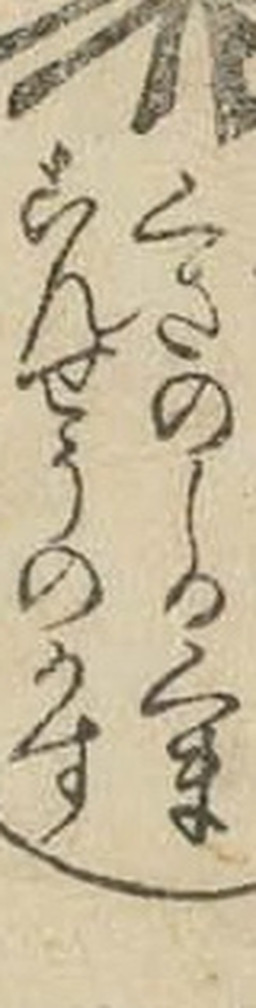こんせうのかす
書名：絵本写宝袋 9巻 8之巻
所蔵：東京学芸大学教育コンテンツアーカイブ
